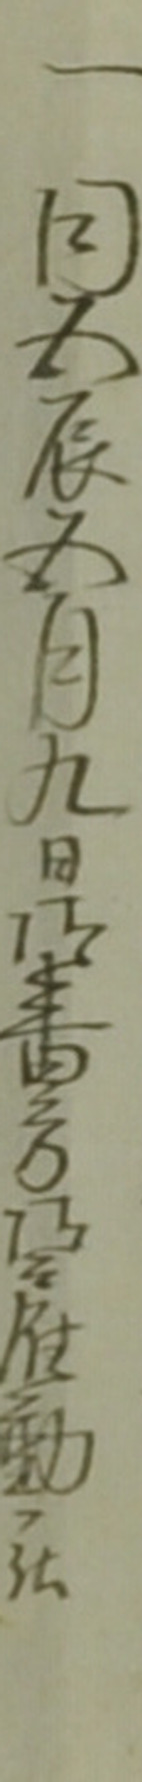一同五辰五月九日御番方御雇勤被
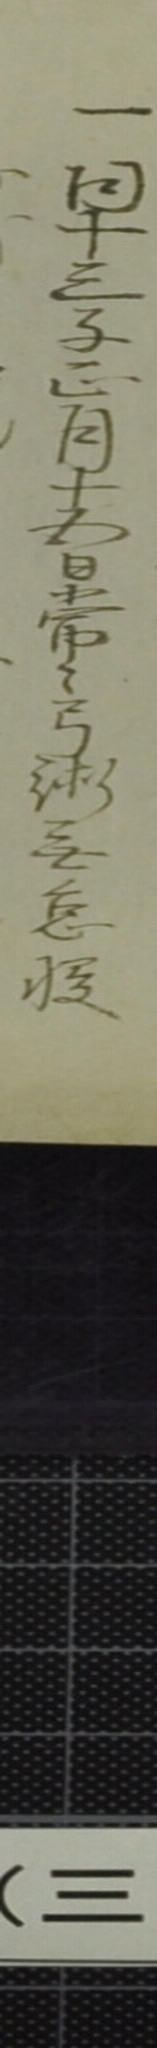一同十三子正月十五日常々弓術無怠慢
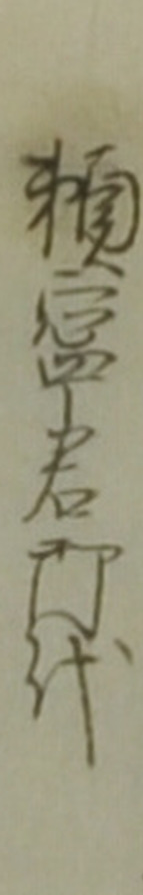頼寧君御代
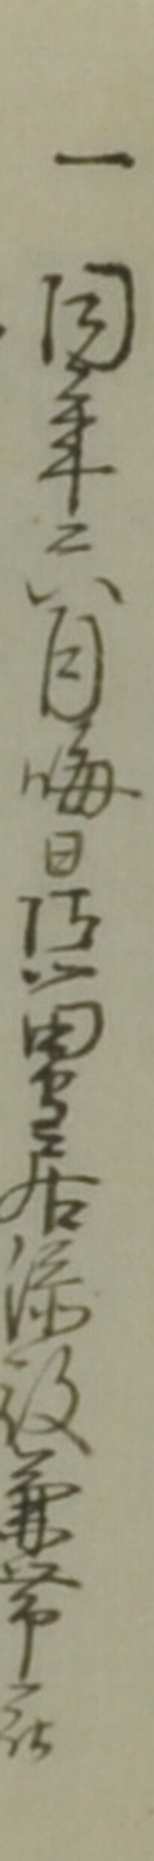一同年六月晦日御留守居添役兼帯被
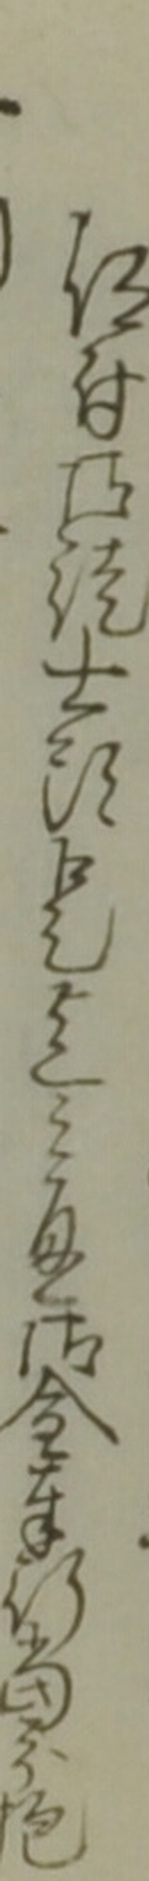仰付御徒士頭是迄之通御金奉行当分抱
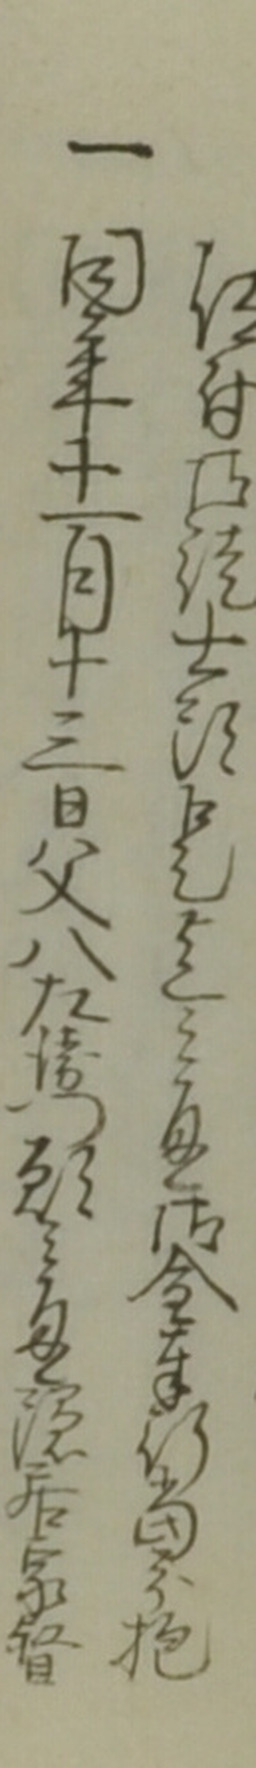一同年十一月十三日父八左衛門願之通隠居家督
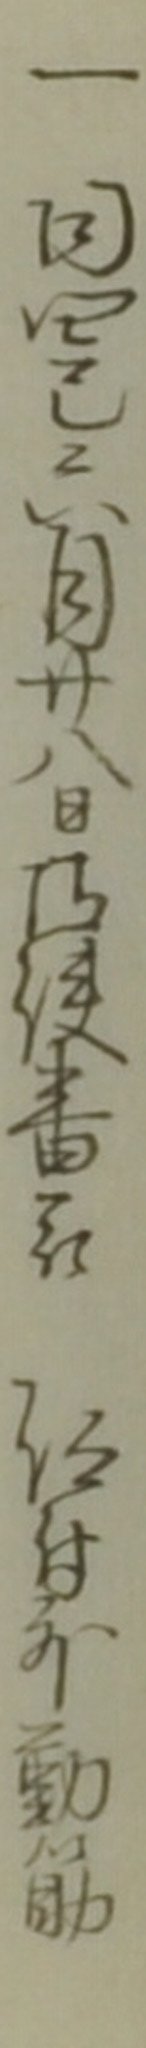一同四巳六月廿八日御使番被仰付外勤筋
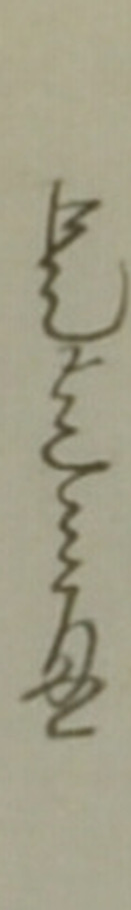是迄之通
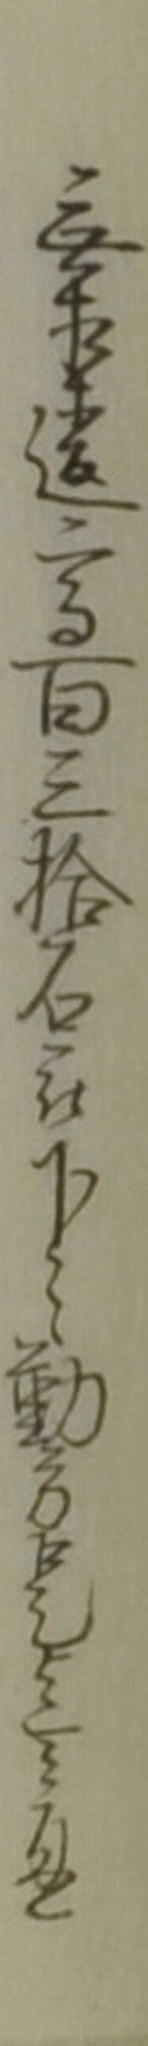無相違高百三拾石被下之勤方是迄之通
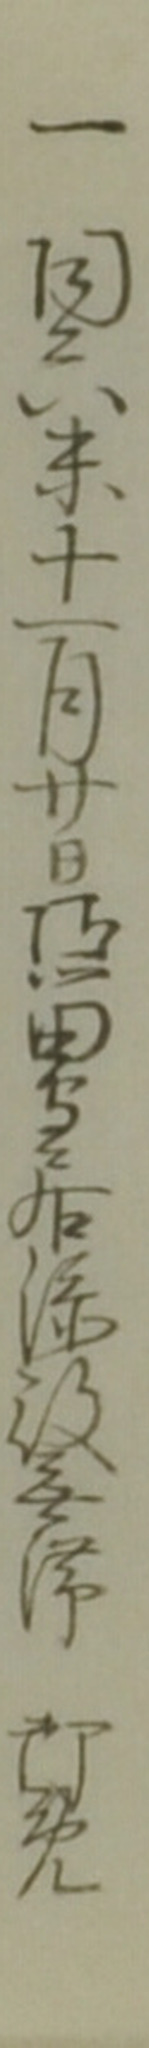一同六未十一月廿日御留守居添役無滞御免
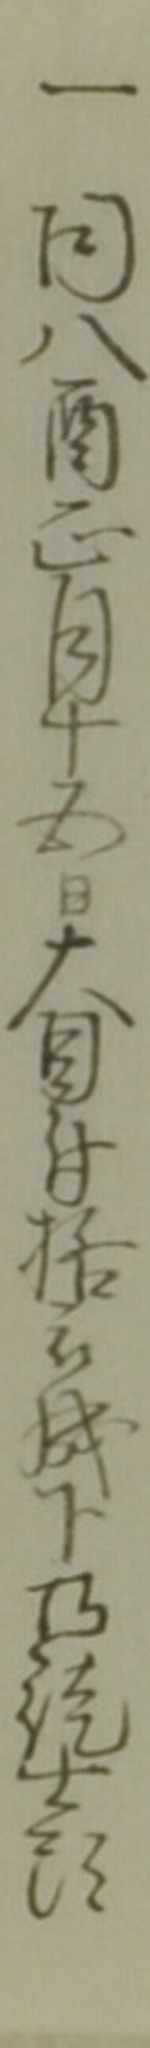一同八酉正月十五日大目付格被成下御徒士頭
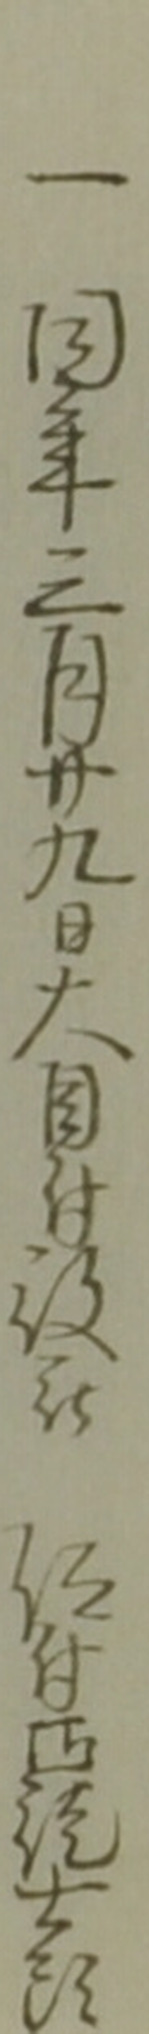一同年三月廿九日大目付役被仰付御徒士頭

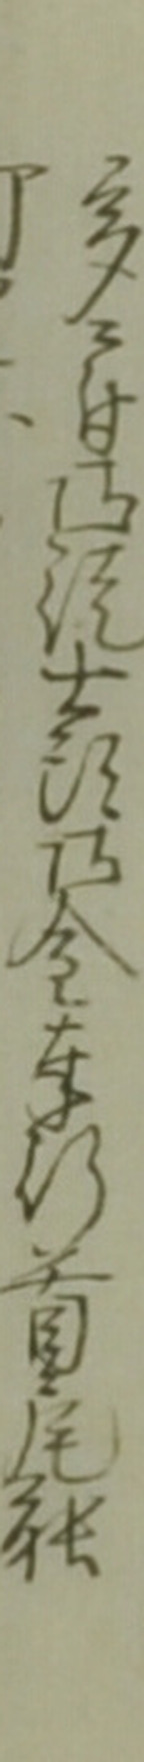多ニ付御徒士頭御金奉行首尾能
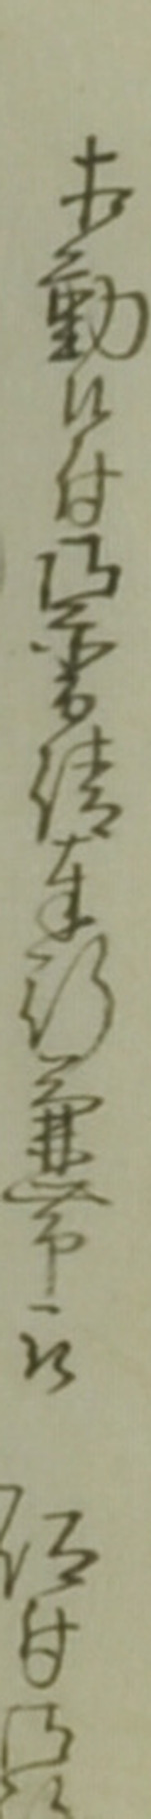相勤候付御普請奉行兼帯被仰付御役
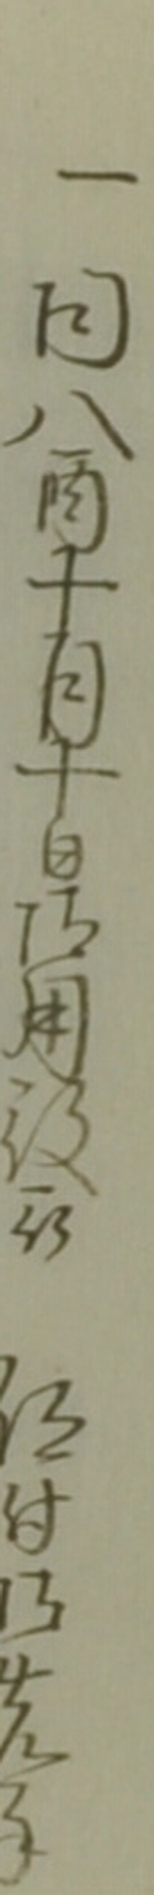一同八酉十月十日御用役被仰付御先手
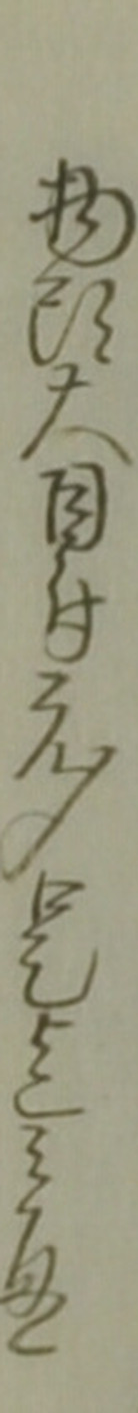物頭大目付元〆是迄之通
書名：給人諸士勤仕録（三）
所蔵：伊那市立高遠町図書館・合同会社AMANE
